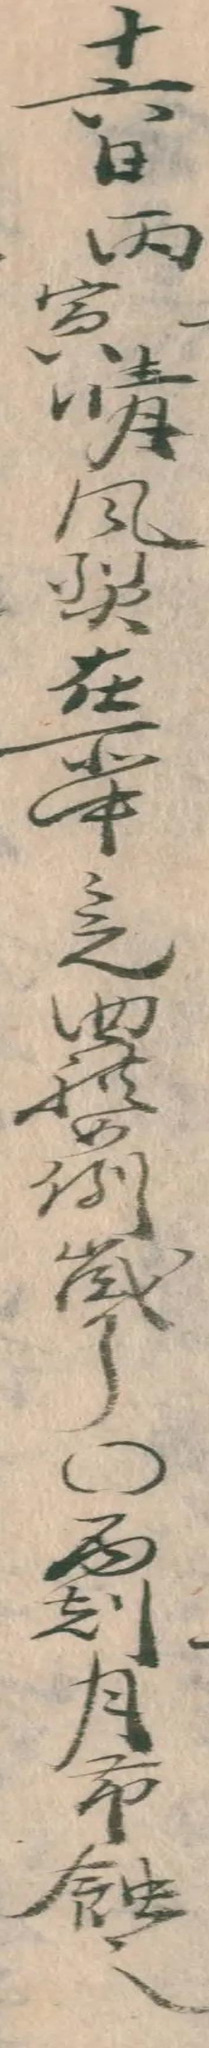十六日丙寅晴風烈在所中々之回礼如例歳了○酉刻月市蝕之
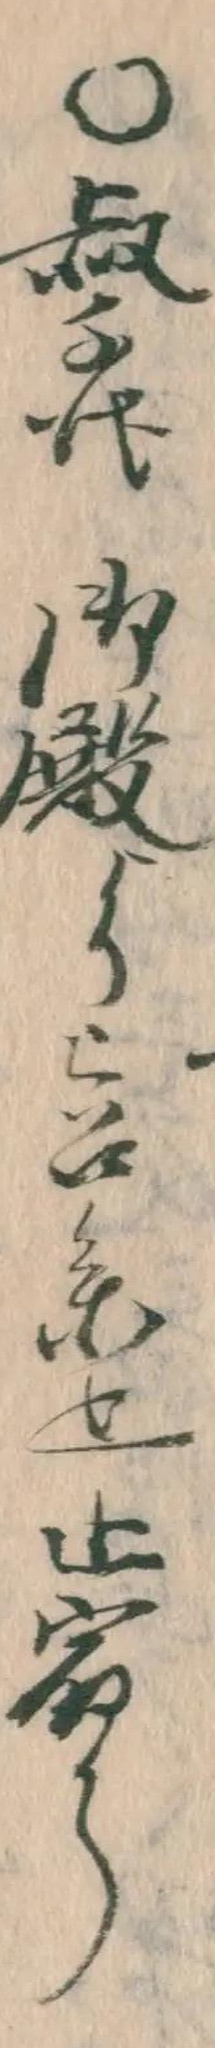○叔千代御殿より被召参也止宿了
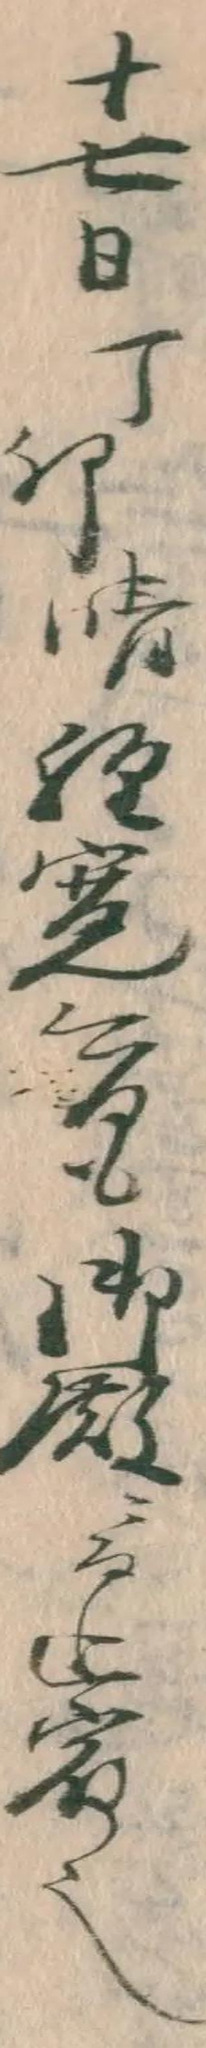十七日丁卯晴経寛今日も御殿ニ而止宿也
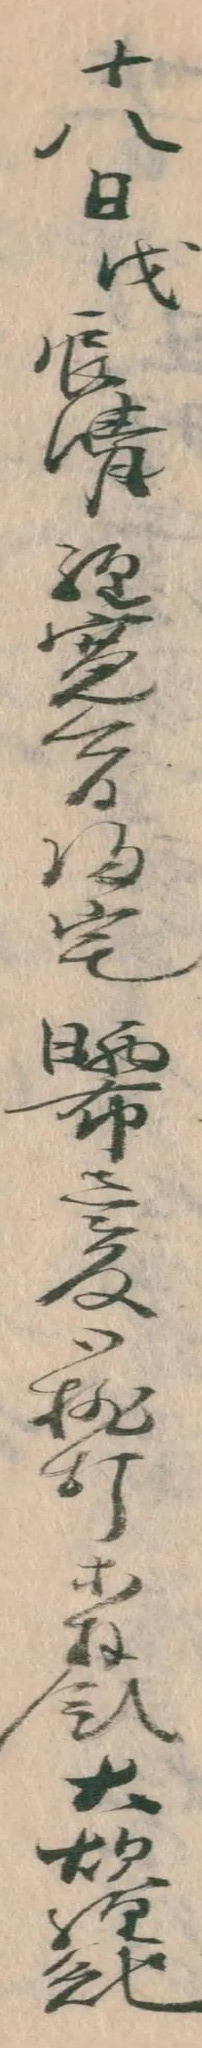十八日戊辰晴経寛今日帰宅晒布壱反御桃灯等拝領大炊経紀
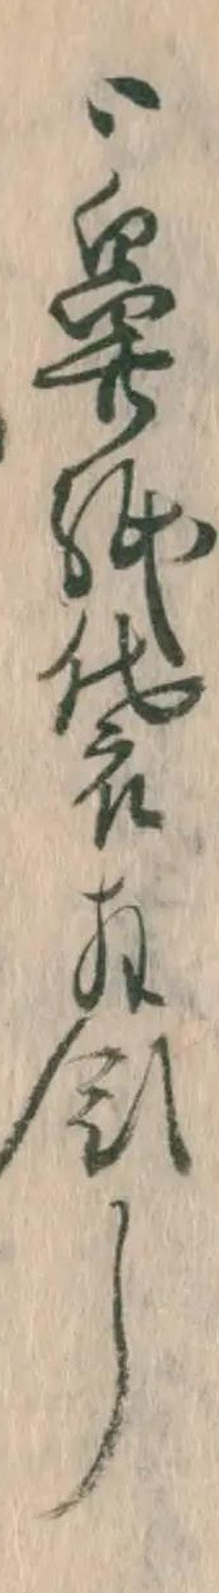御鼻紙袋拝領了
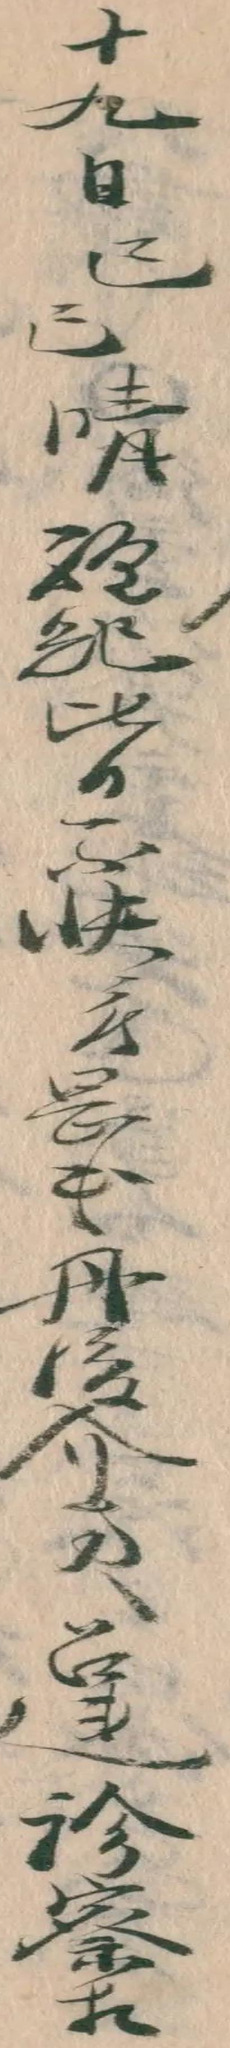十九日己巳晴経紀比日不快ニ付岡本丹後介方へ召連診察相
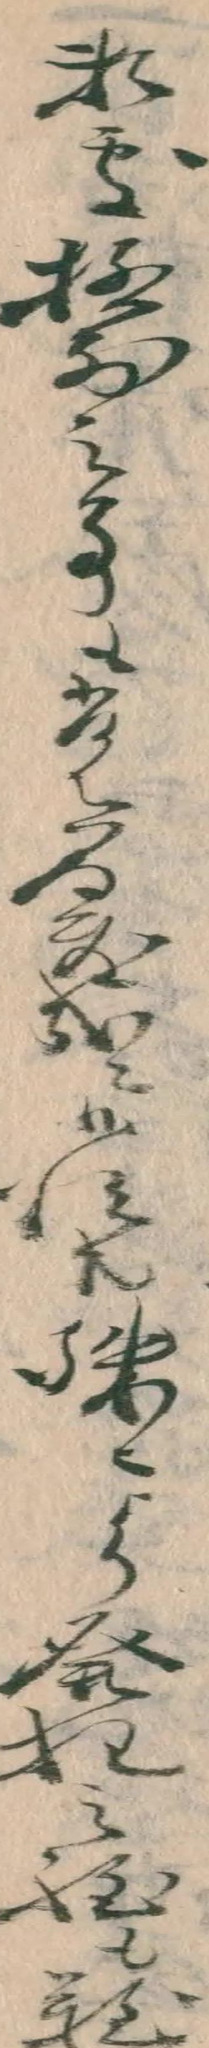頼處格別之事も有之間敷成ニ候得共殊二より発狂之程も難
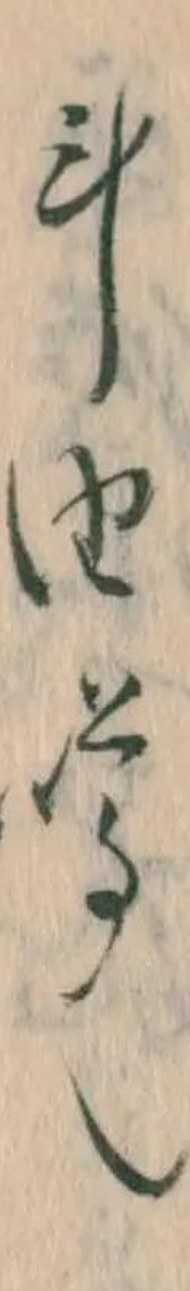斗由噂也
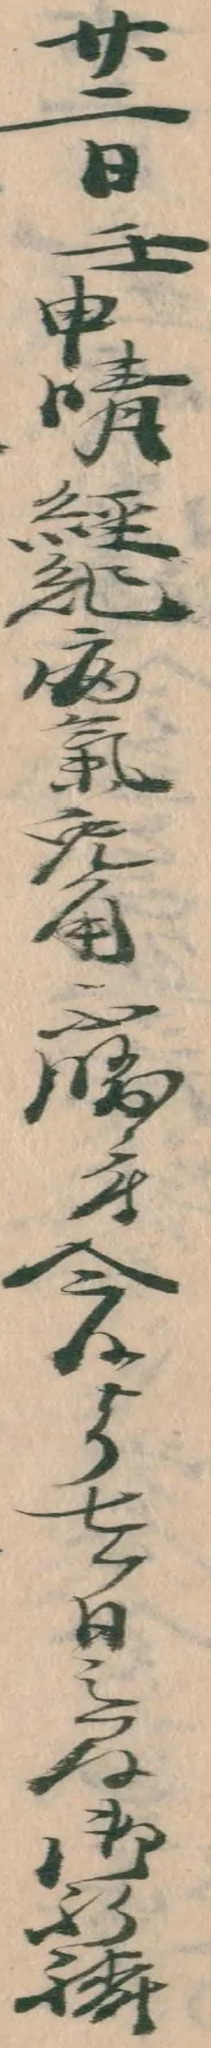廿二日壬申晴経紀病氣兎角不勝ニ付今日より七ケ日之間御祈祷
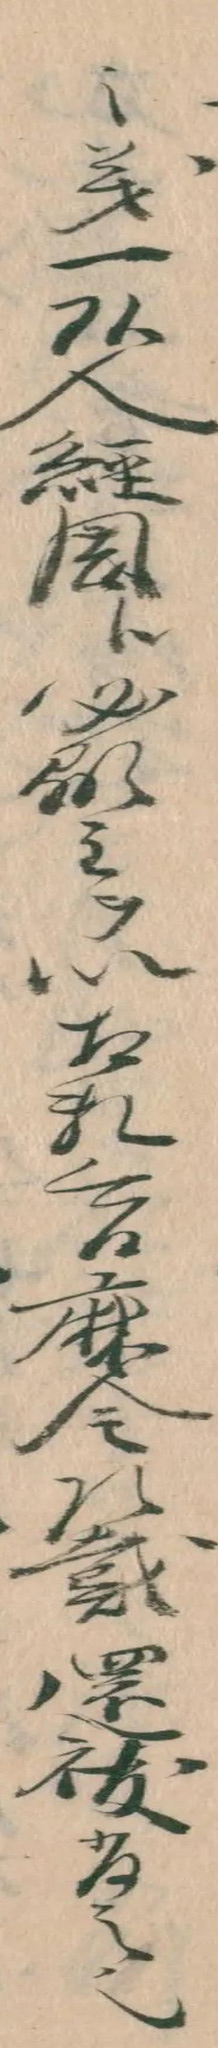之義一頭人経周ト必顕主ヲ以相頼今日麻令頂戴還祓有之也
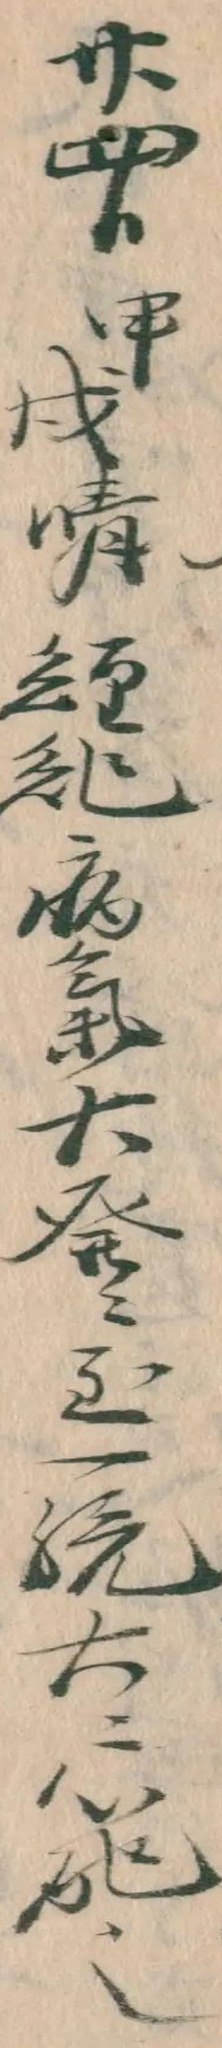廿四日甲戌晴経紀病氣大発に至一統大ニ心配也
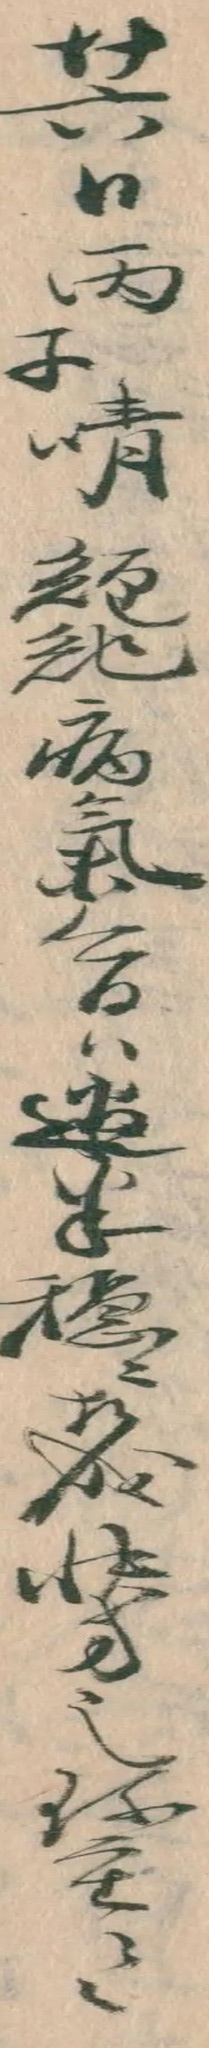廿六日丙子晴経紀病気今日ハ過半穏ニ相成快方之珍重々々
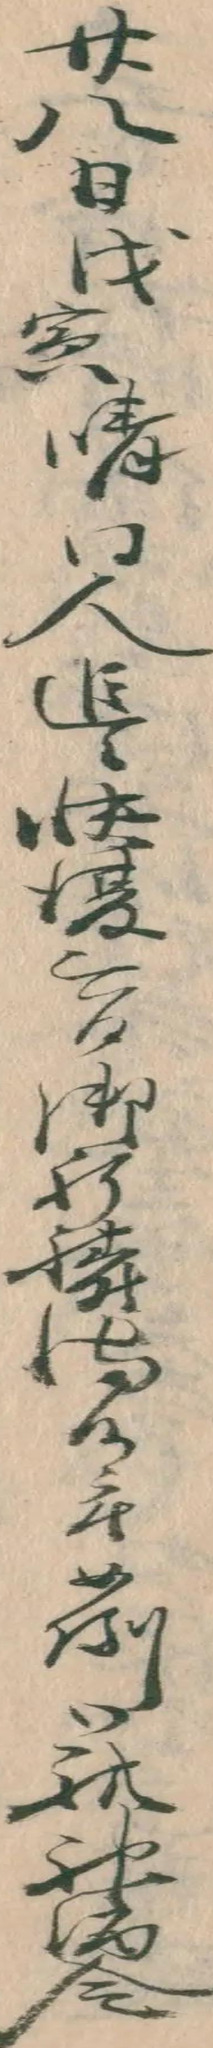廿八日戊寅晴同人追々快復今日御祈祷仕候ニ付如例御礼神酒令
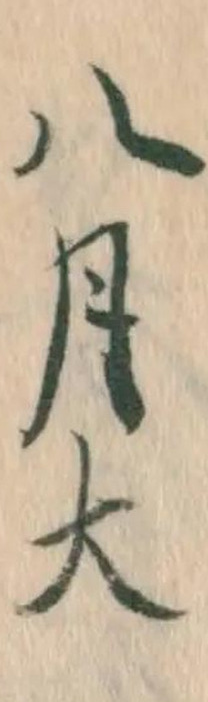八月大
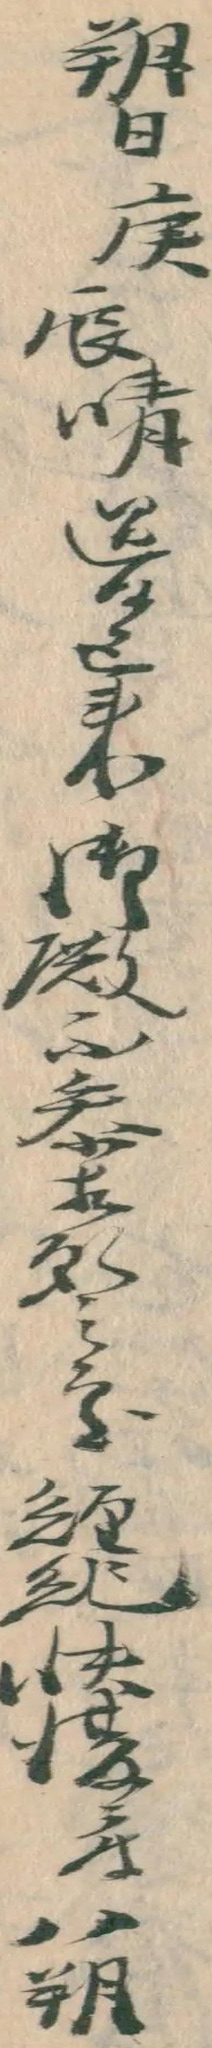朔日庚辰晴過日已来御殿不参相願之處経紀快復ニ付八朔
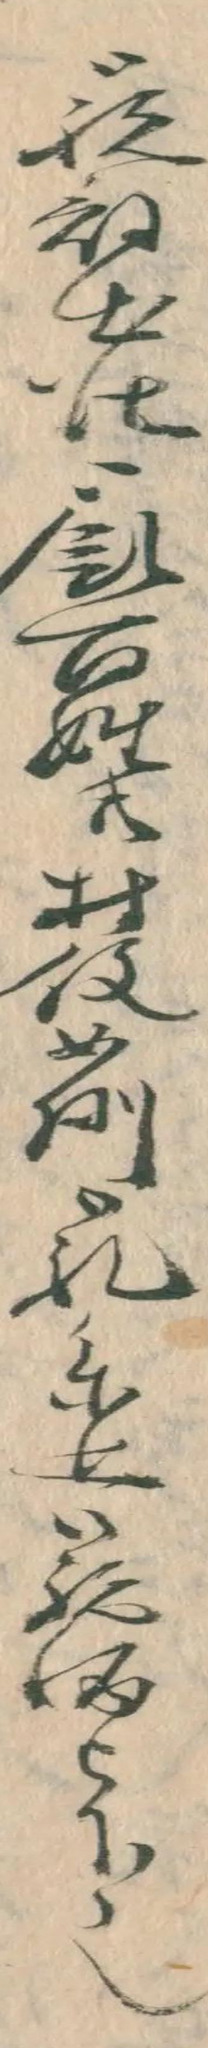御祝詞出仕御領百姓共村役如例御礼参上御祝酒被下也
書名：賀茂社記録. 第66冊
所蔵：国立国会図書館 National Diet Library, JAPAN
